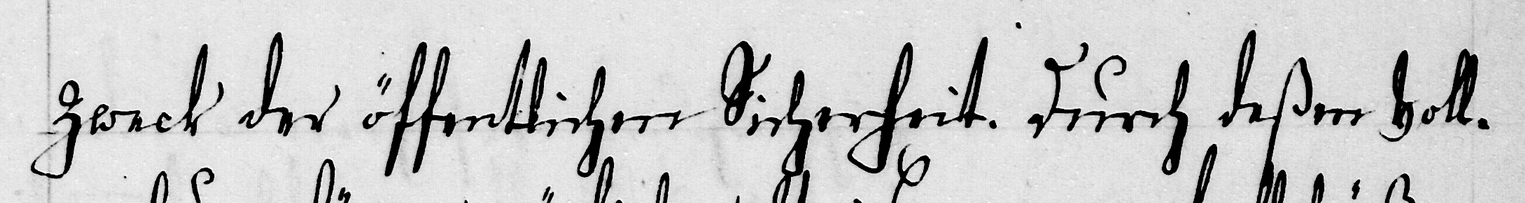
Zweck der öffentlichen Sicherheit. Durch deßen Voll¬
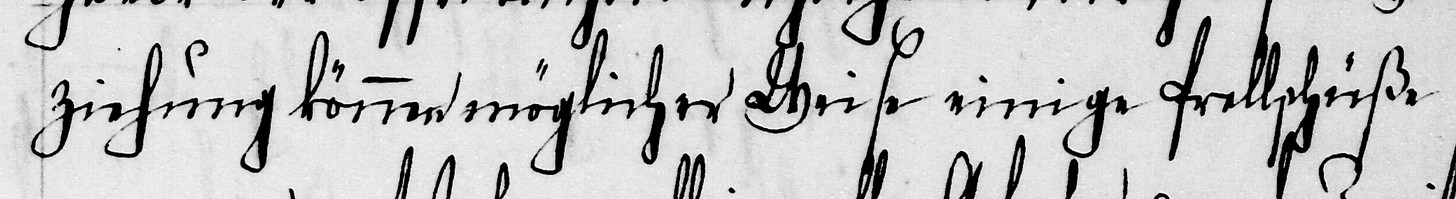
ziehung können möglicher Weise einige Prellschüße
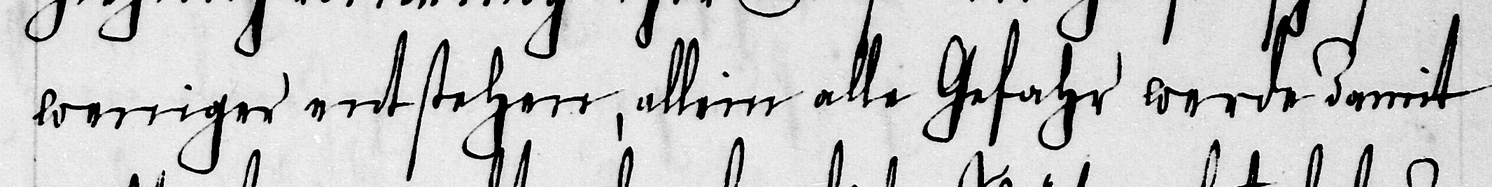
weniger entstehen, allein alle Gefahr werde damit
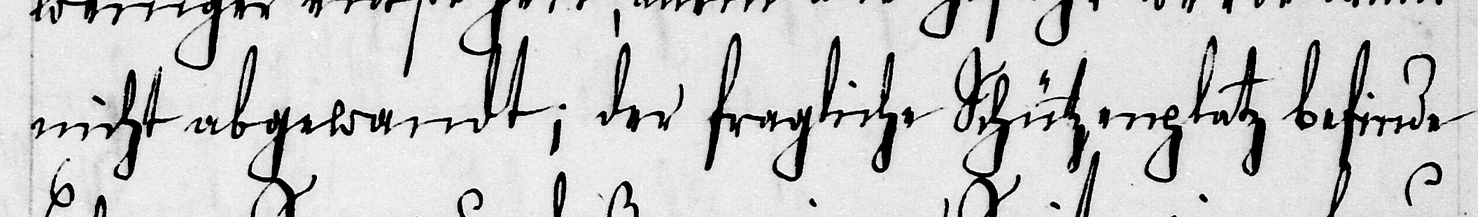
nicht abgewandt; der fragliche Schützenplatz befinde
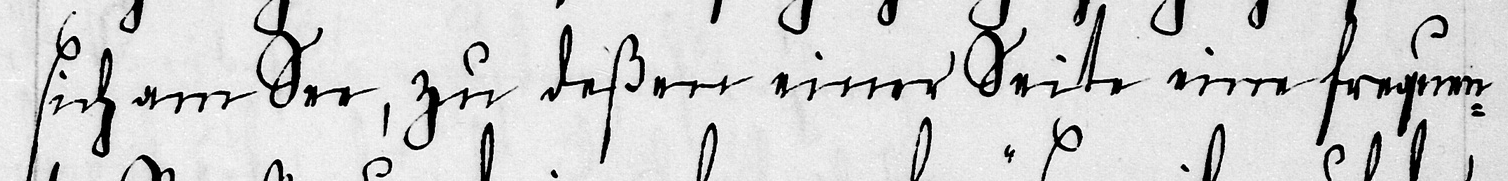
sich am See, zu deßen einer Seite eine frequen¬
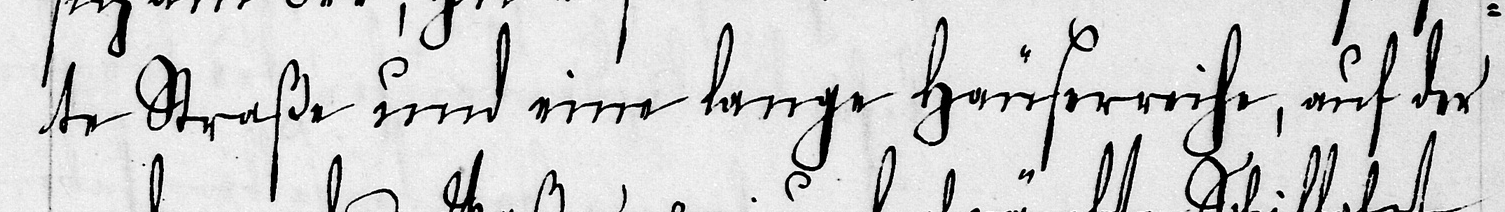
te Straße und eine lange Häuserreihe, auf den
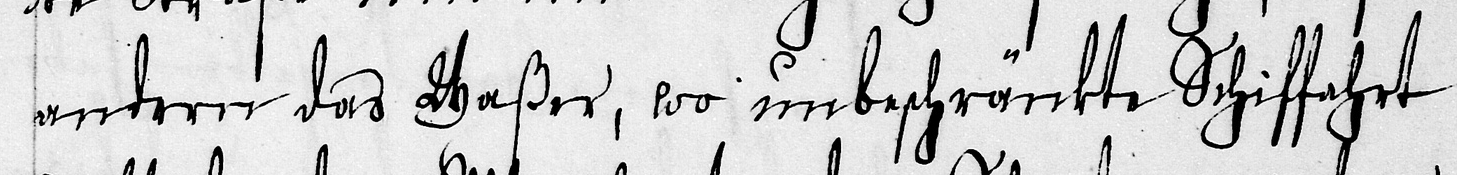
andern das Waßer, wo unbeschränkte Schiffahrt
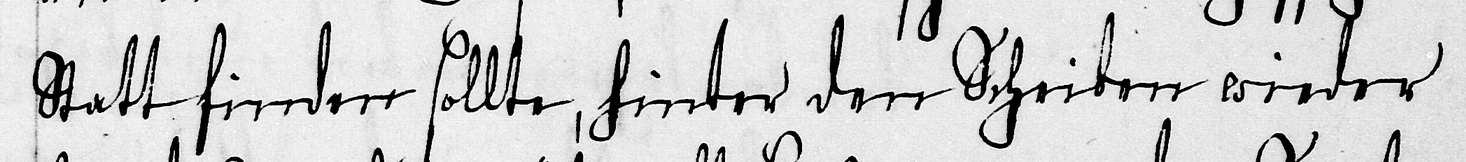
Statt finden sollte, hinter den Scheiben wieder
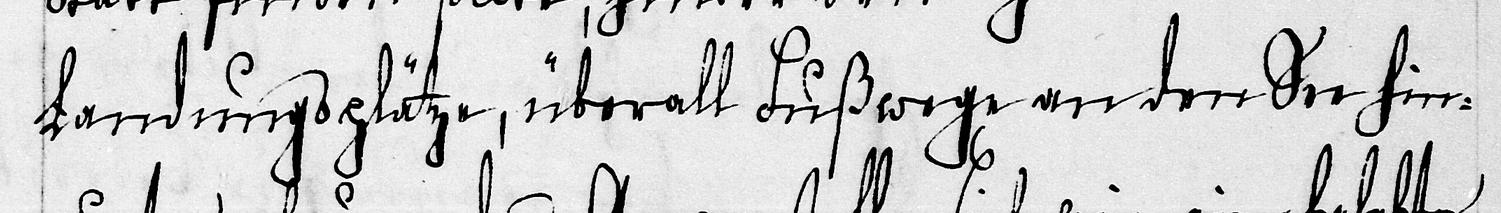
Landungsplätze, überall Fußwege an den See hin¬
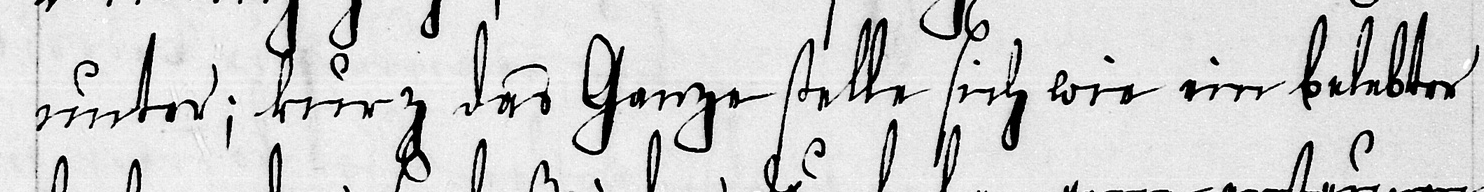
unter; kurz das Ganze stelle sich wie ein belebter
